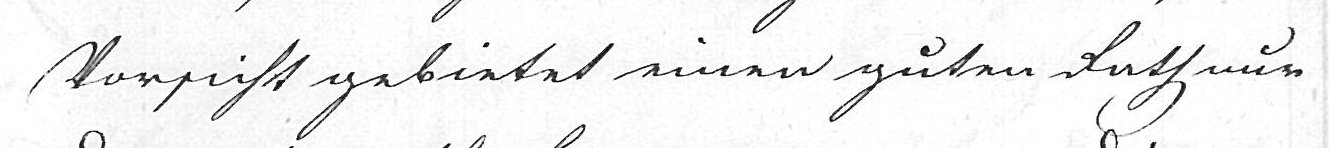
Vorsicht gebietet einen guten Rath nur
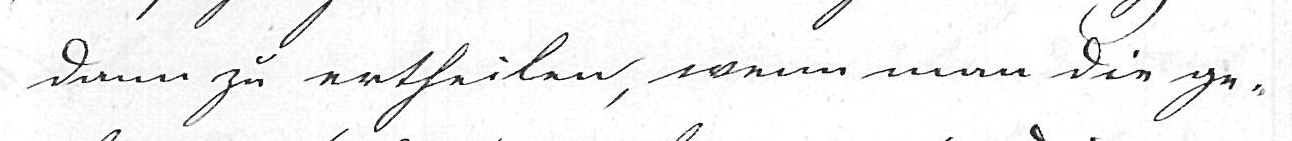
dann zu ertheilen, wenn man die ge-
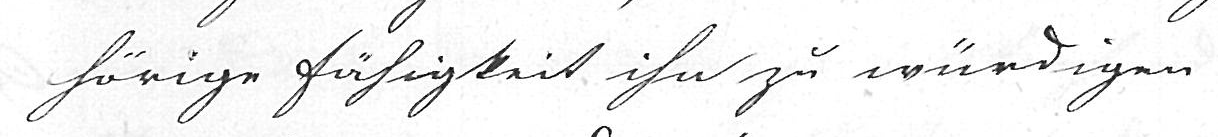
hörige Fähigkeit ihn zu würdigen
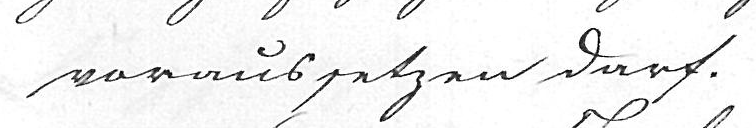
voraussetzen darf.
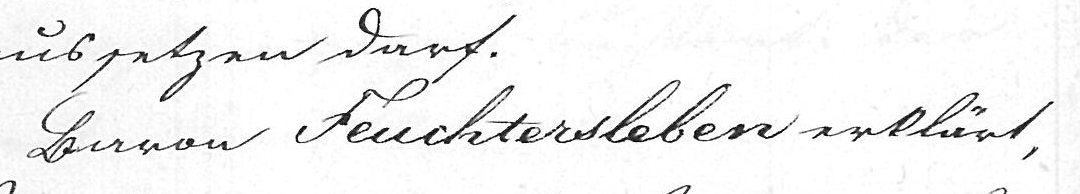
Baron Feuchtersleben erklärt,
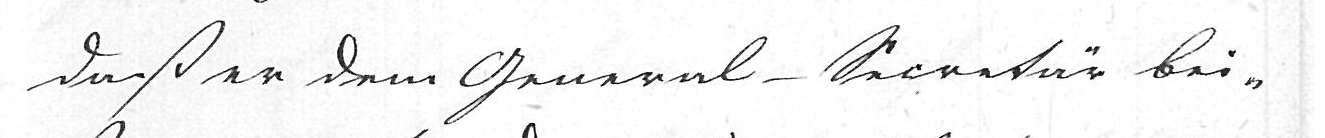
daß er dem General-Secretär bei-
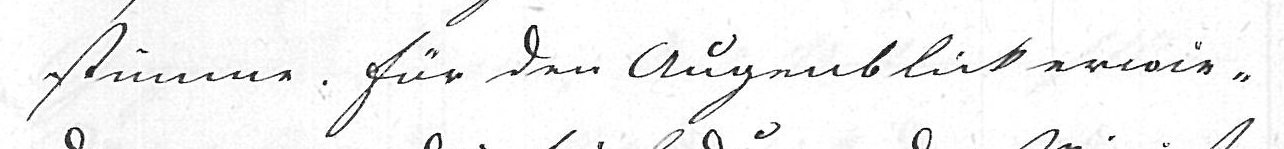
stimme. Für den Augenblick erwie-
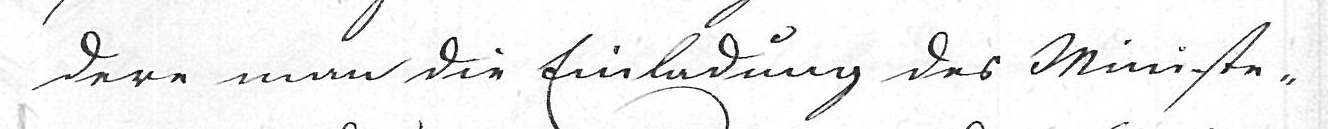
dere man die Einladung des Ministe-
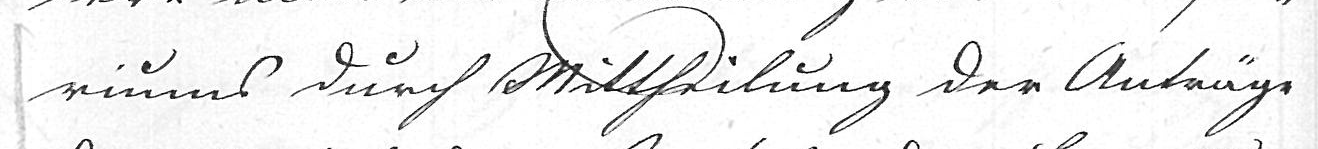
riums durch Mittheilung der Anträge
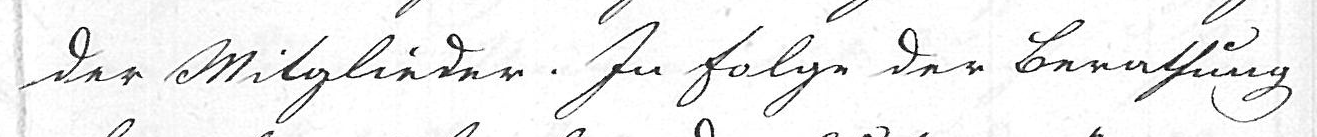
der Mitglieder: In Folge der Berathung
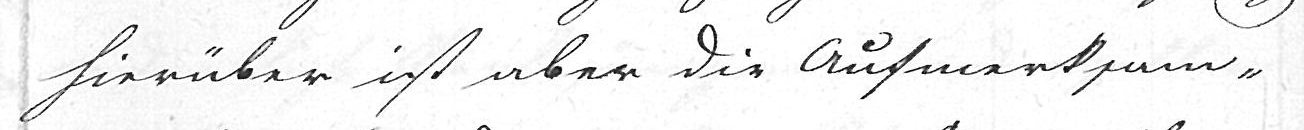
hierüber ist aber die Aufmerksam-
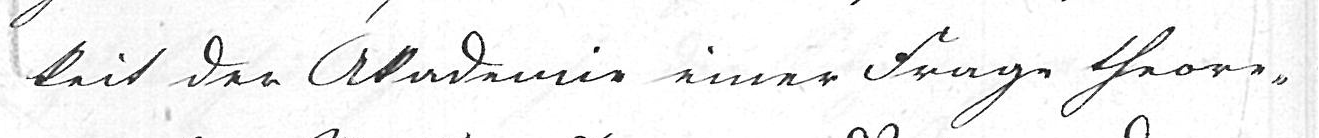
keit der Akademie einer Frage theor-
